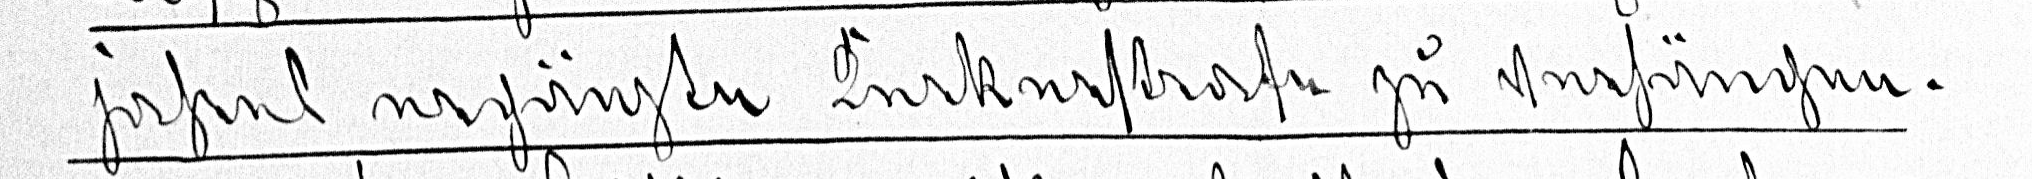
jahres ergänzte Kerkerstrafe zu verhängen.
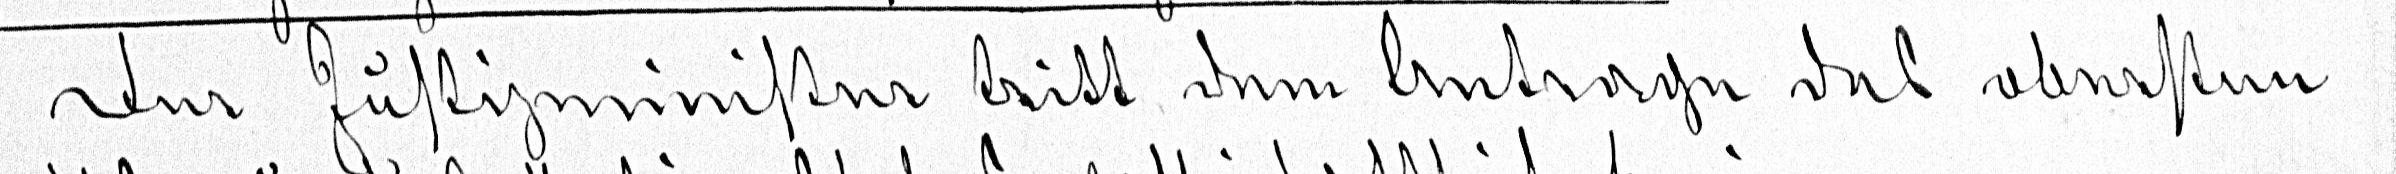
Der Justizminister tritt dem antrage des obersten
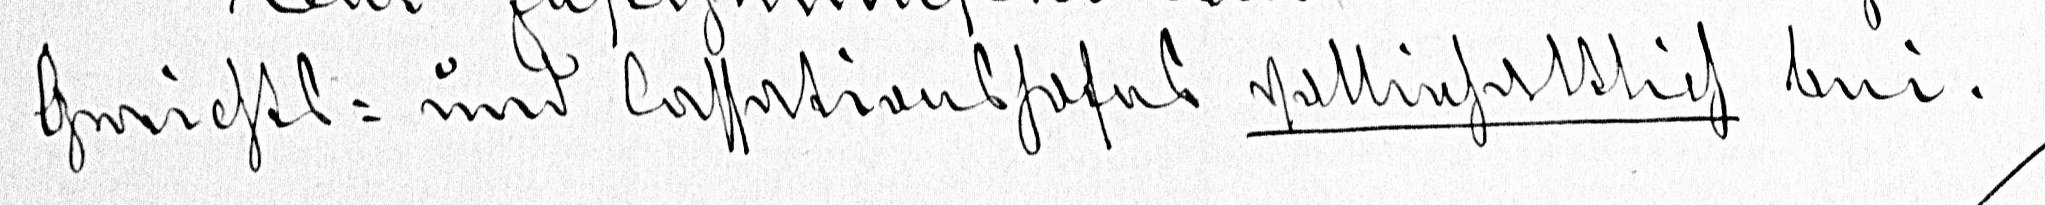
Gerichts- und Cassationshofes vollinhaltlich bei.
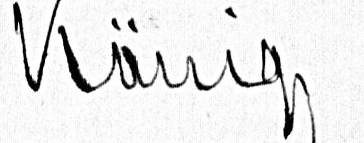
König
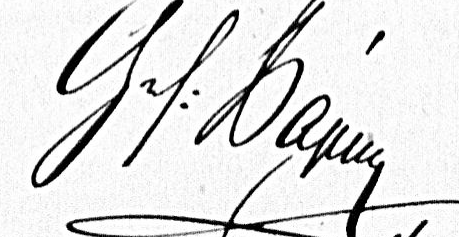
Ges. xx
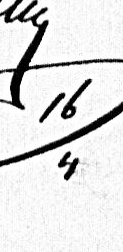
16/4
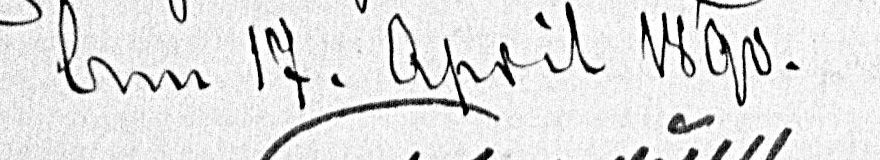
Am 17. April 1890.
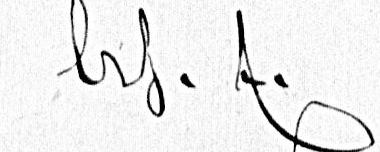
Ah. E.
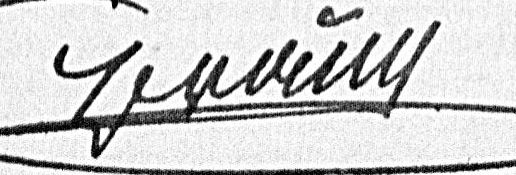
xx
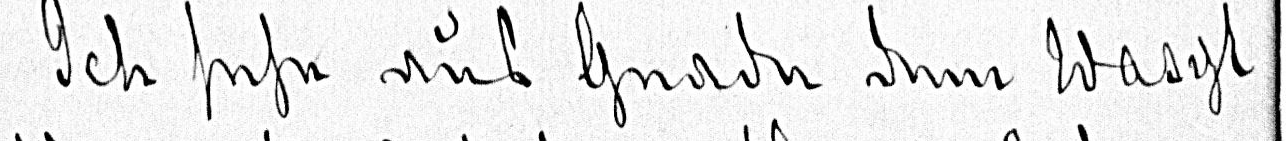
Ich sehe aus Gnade dem Wasyl
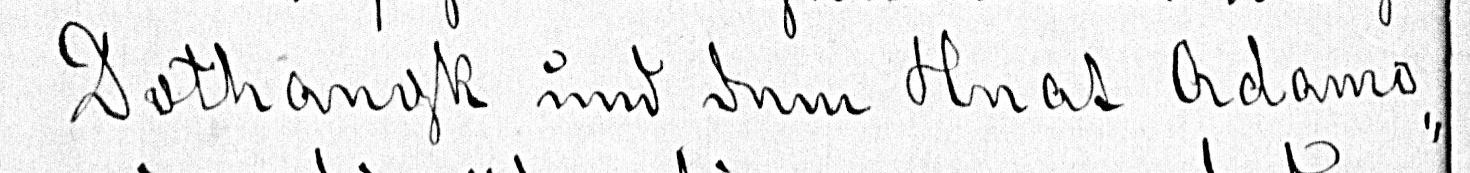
Dothanyk und dem Hnat Adamo¬
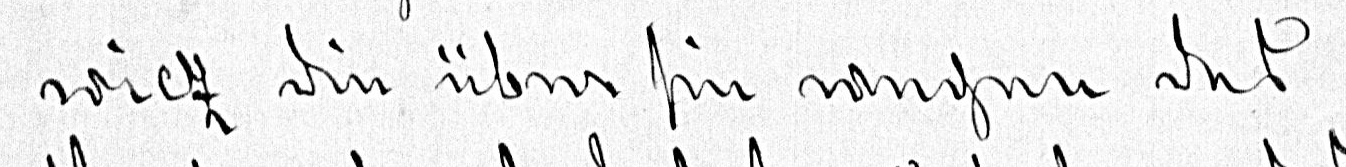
wicz die über sie wegen des
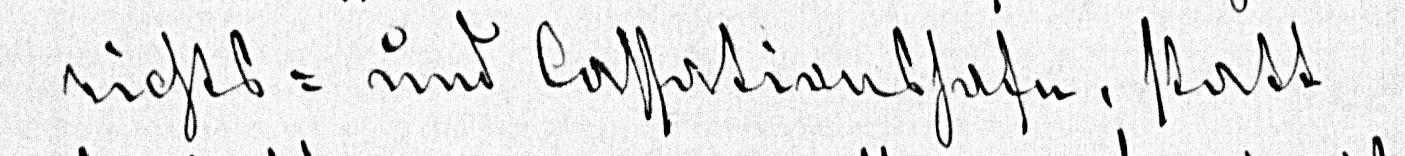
richts- und Cassationshofe, statt
